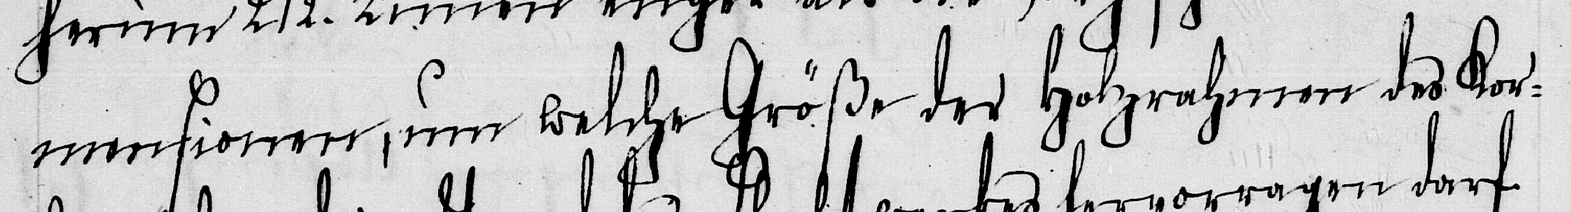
mensionen, um welche Größe der Holzrahmen des Kor¬
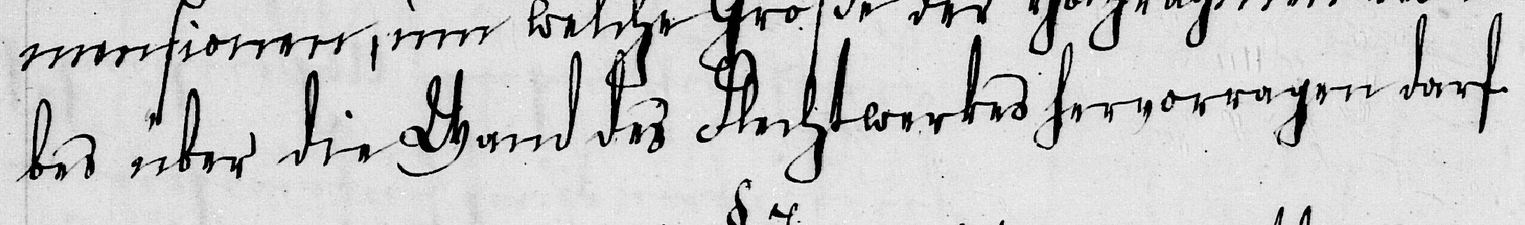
bes über die Wand des Flechtwerkes hervorragen darf.
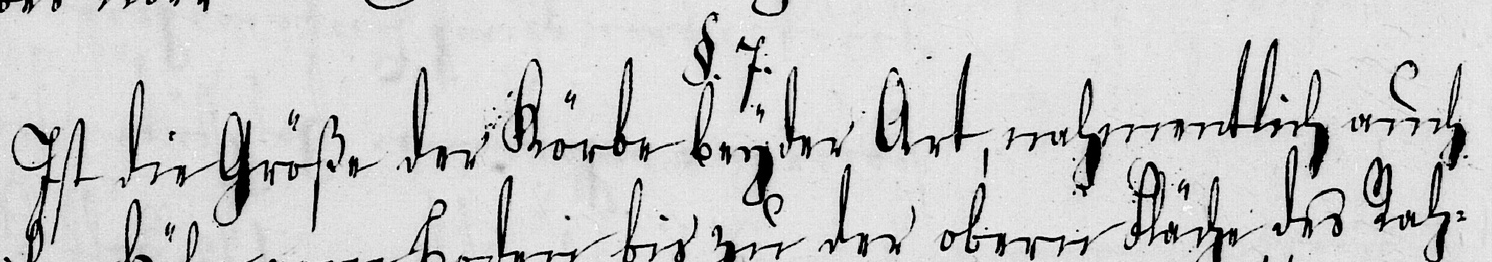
Ist die Größe der Körbe beyder Art, nahmentlich auch
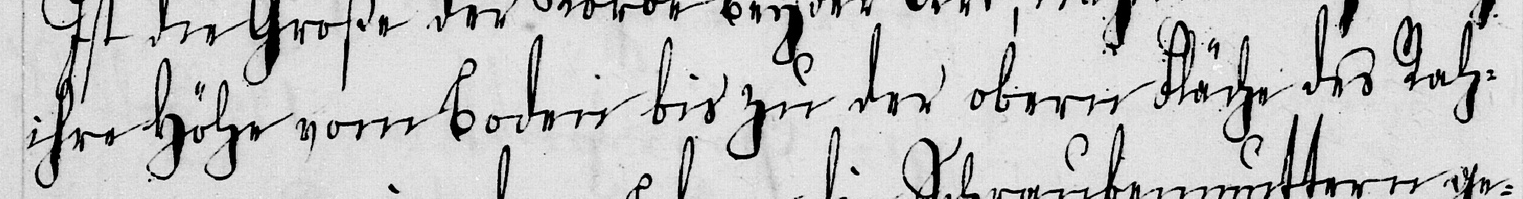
ihre Höhe vom Boden bis zu der obern Fläche des Rah¬
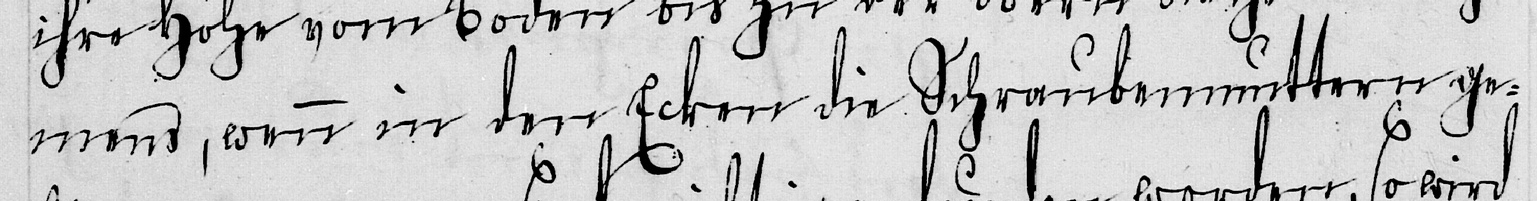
mens, wenn in den Ecken die Schraubenmuttern ge¬
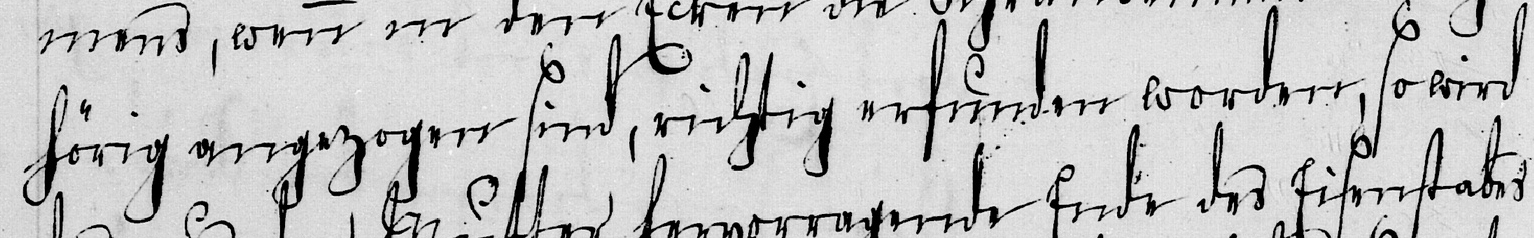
hörig angezogen sind, richtig erfunden worden, so wird
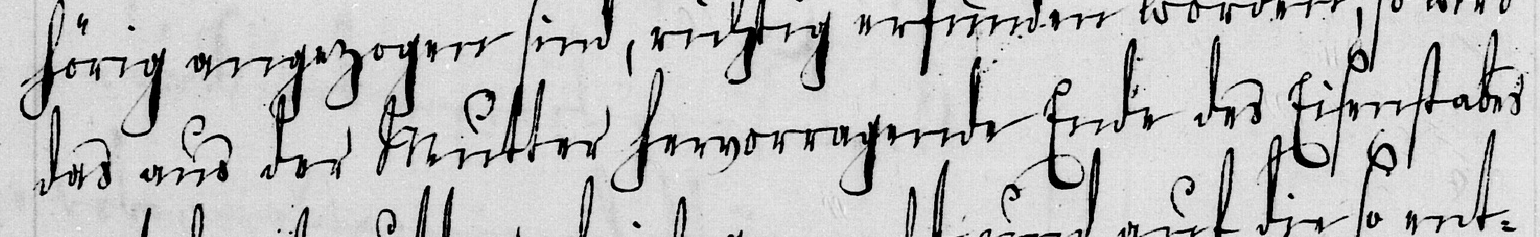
das aus der Mutter hervorragende Ende des Eisenstabes
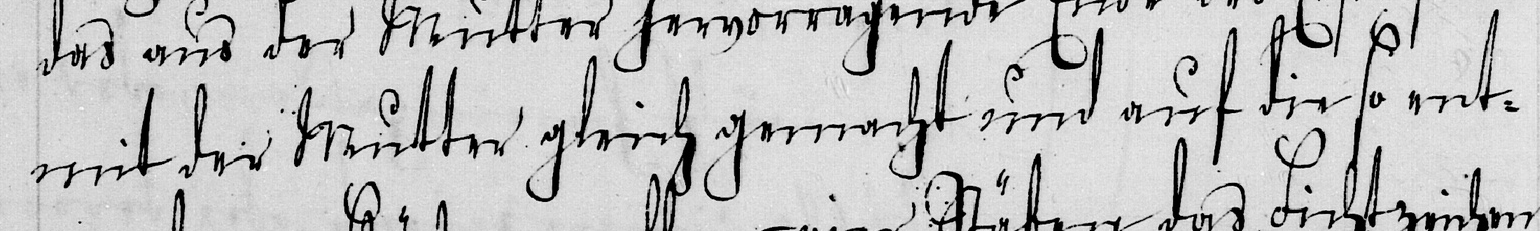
mit der Mutter gleich gemacht und auf die so ent¬
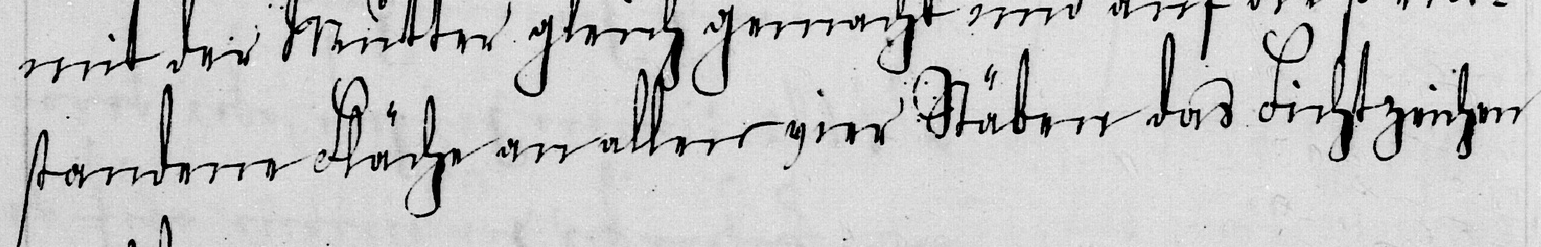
standene Fläche an allen vier Stäben das Lichtzeichen
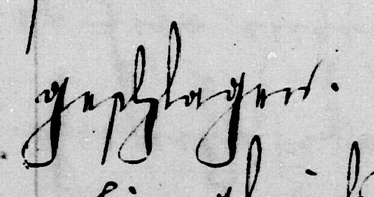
geschlagen.
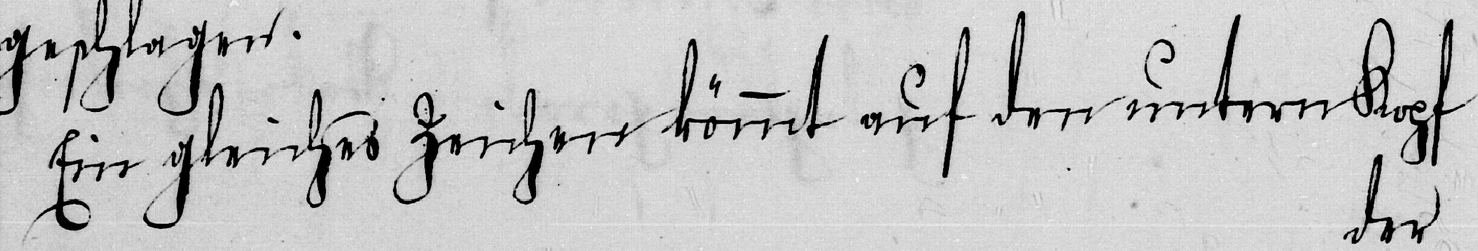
Ein gleiches Zeichen kömmt auf den untern Kopf
